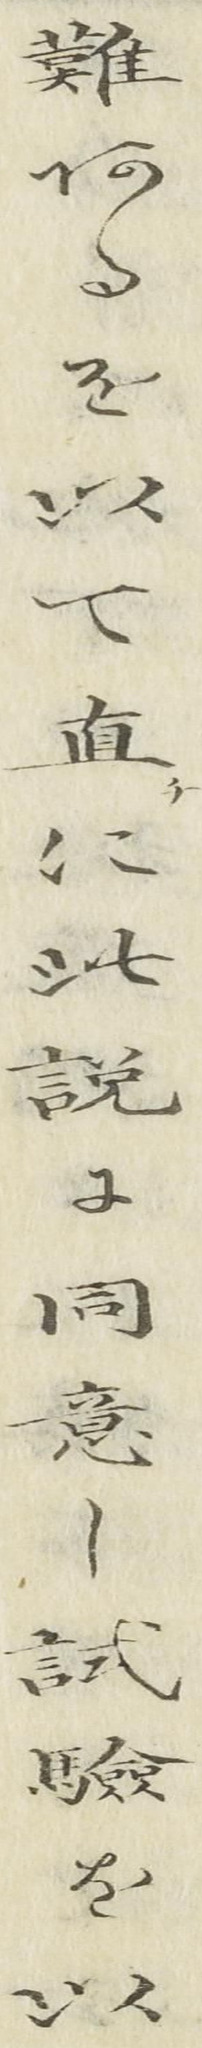難あるを以て直に此説に同意し試験を以
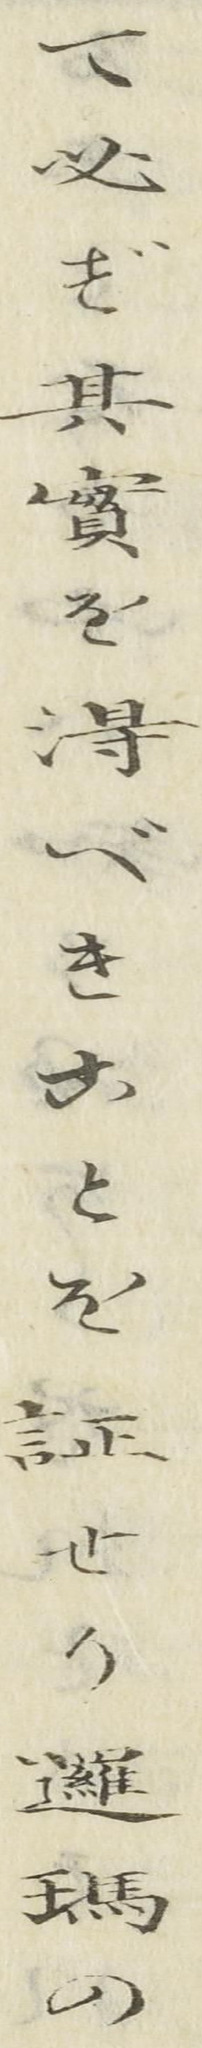て必ず其実を得べきことを証せり邏瑪の
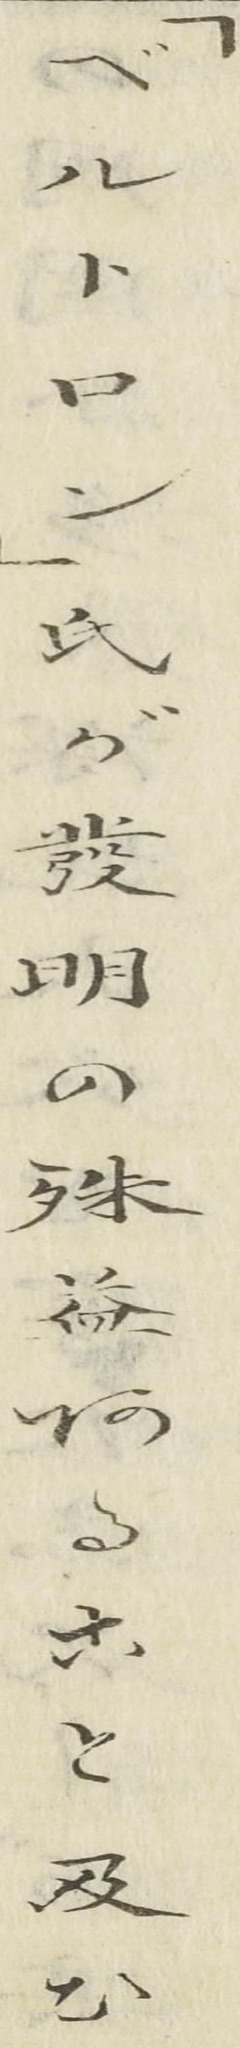「ベルトロン」氏が発明の殊益あること及ひ
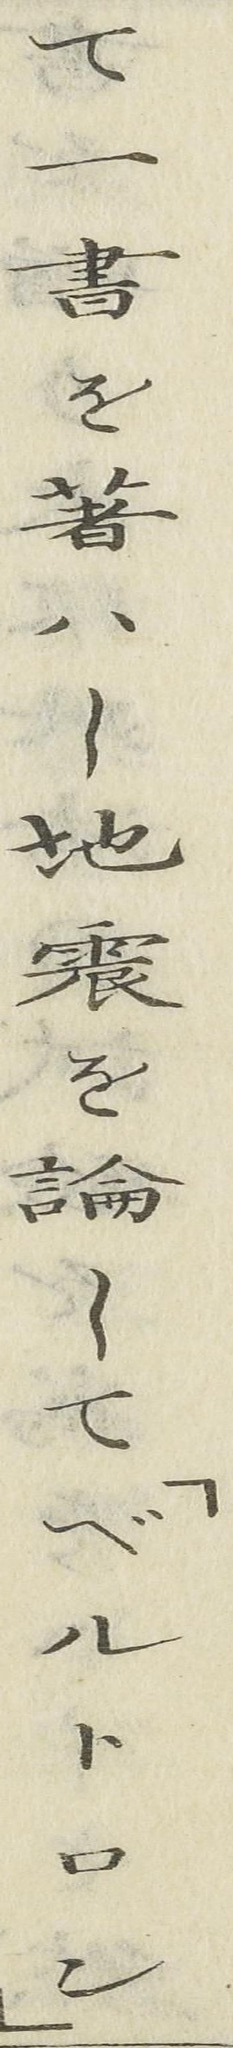て一書を著はし地震を論して「ベルトロン」
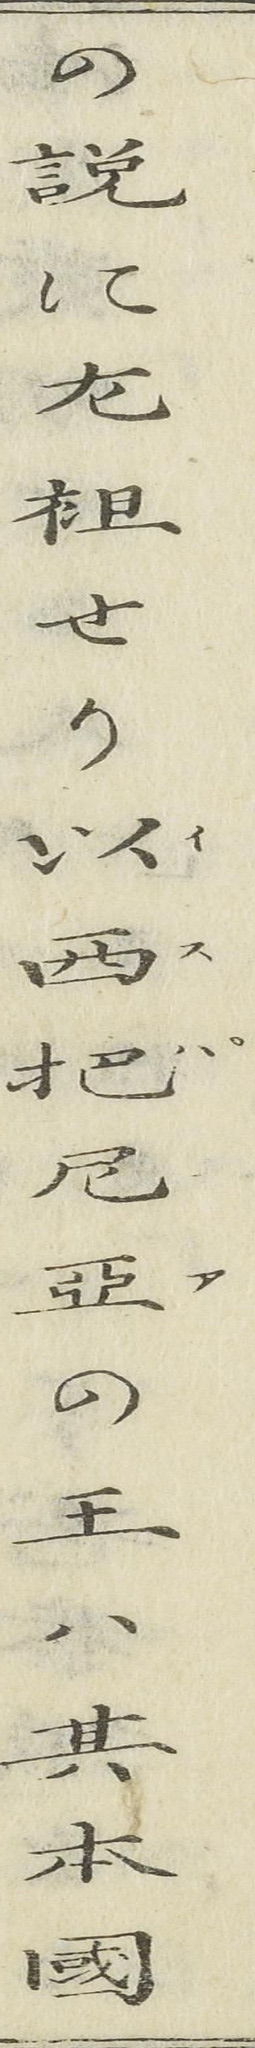の説に左袒せり以西把尼亜の王は其本国
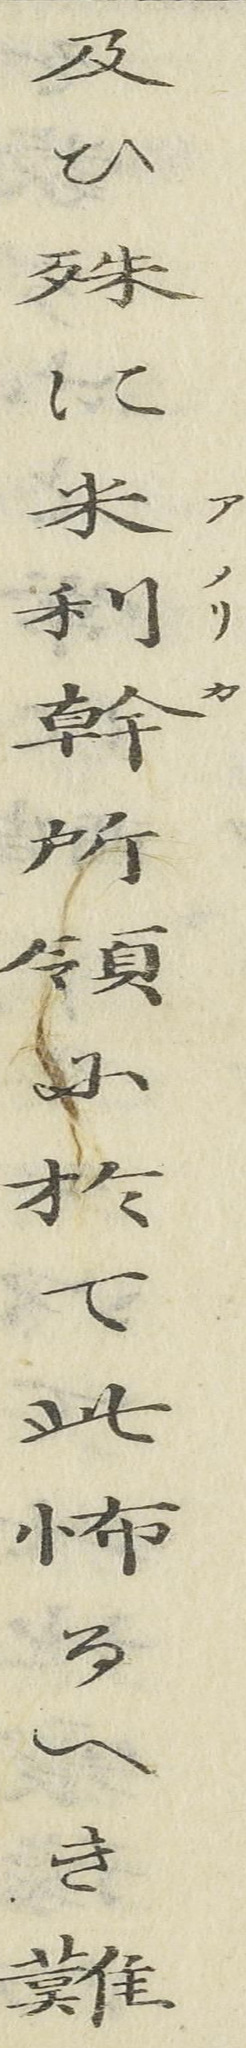及ひ殊に米利幹所領に於て此怖るへき難

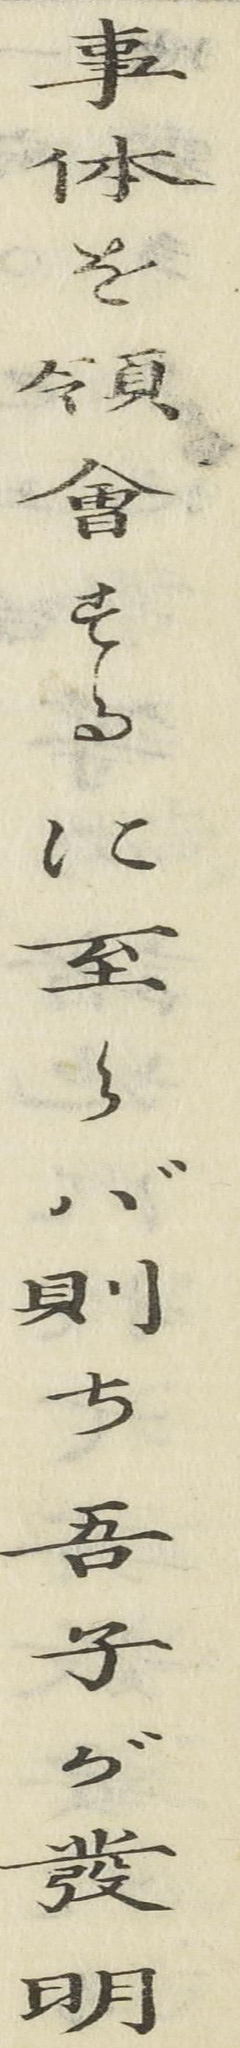事体を領会するに至らば則ち吾子が発明
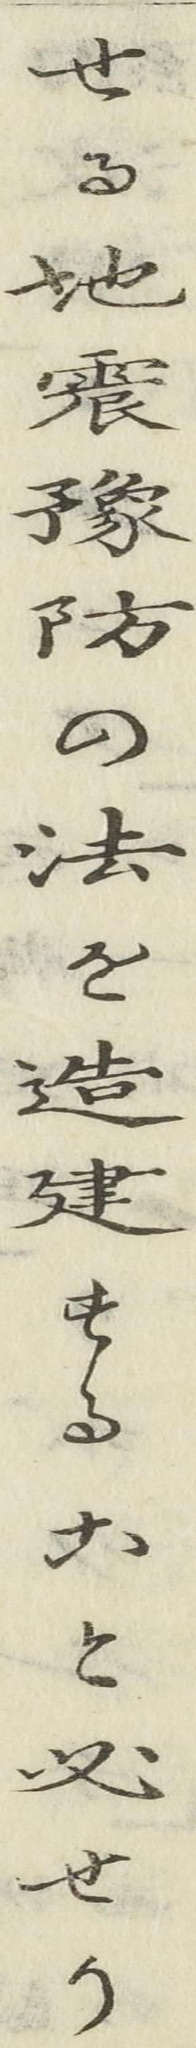せる地震豫防の法を造建すること必せり
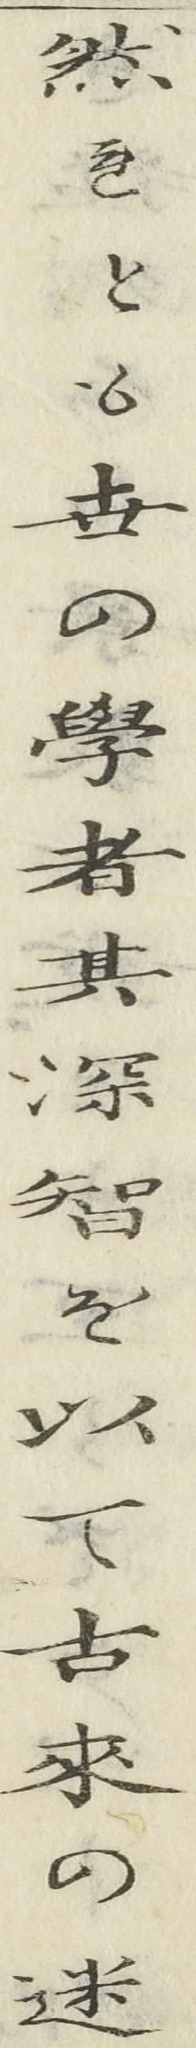然れとも世の学者其深智を以て古来の迷
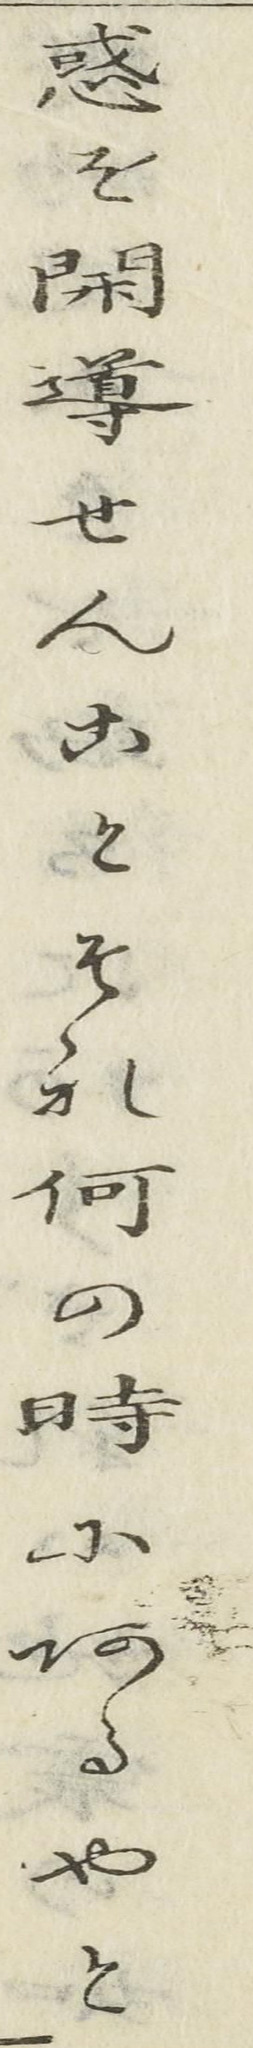惑を開導せんことそれ何の時にあるやと」
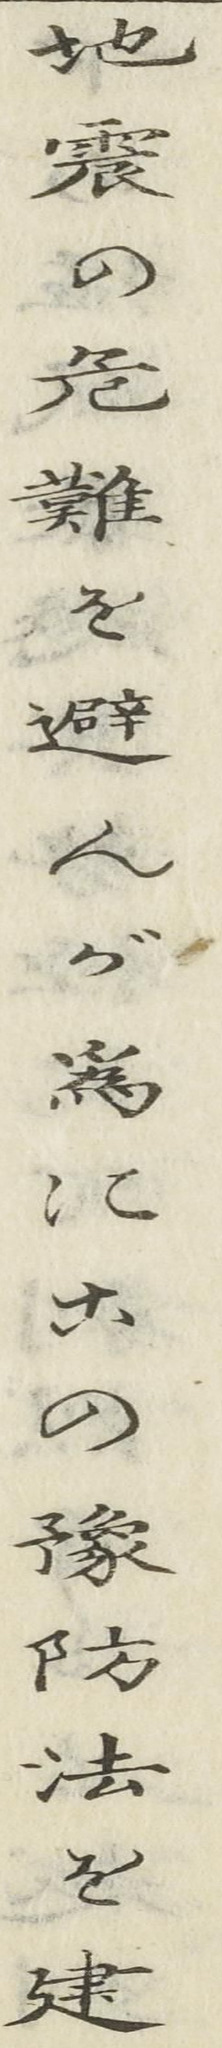地震の危難を避んが為にこの豫防法を建
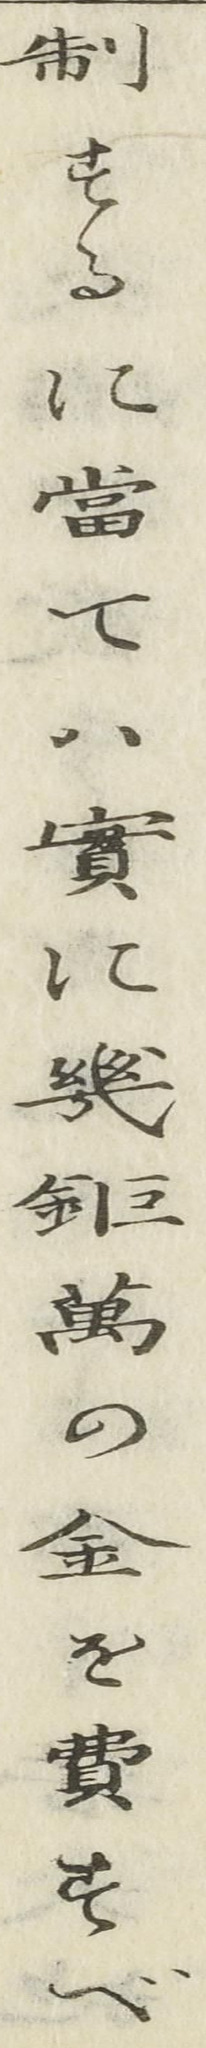制するに当ては実に幾鉅萬の金を費すべ
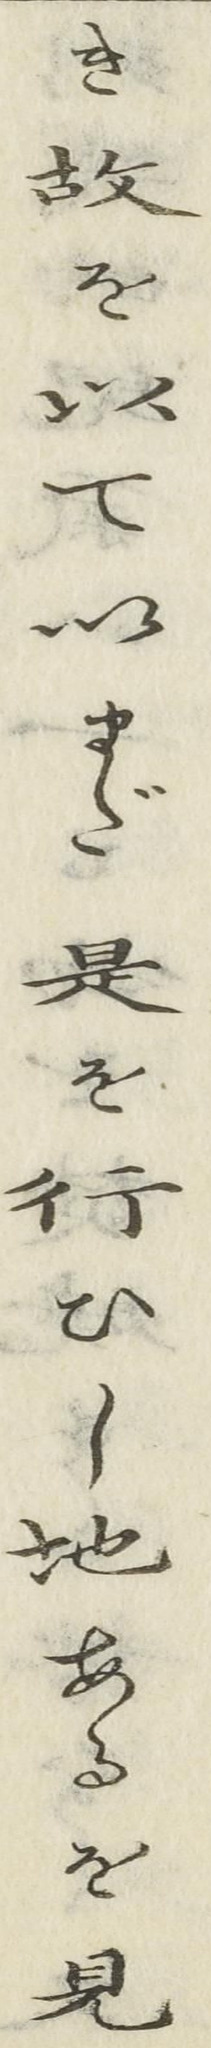き故を以ていまだ是を行ひし地あるを見
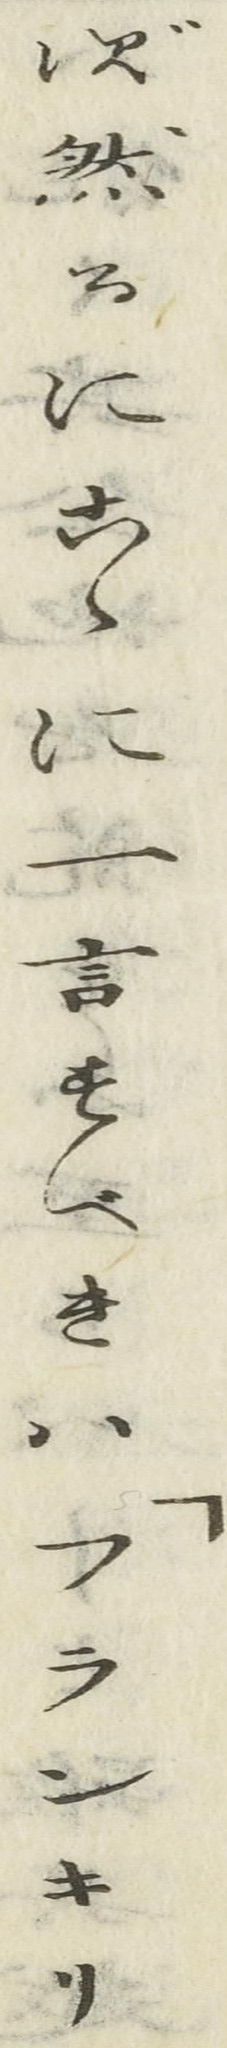ず然るにこゝに一言すべきは「フランキリ
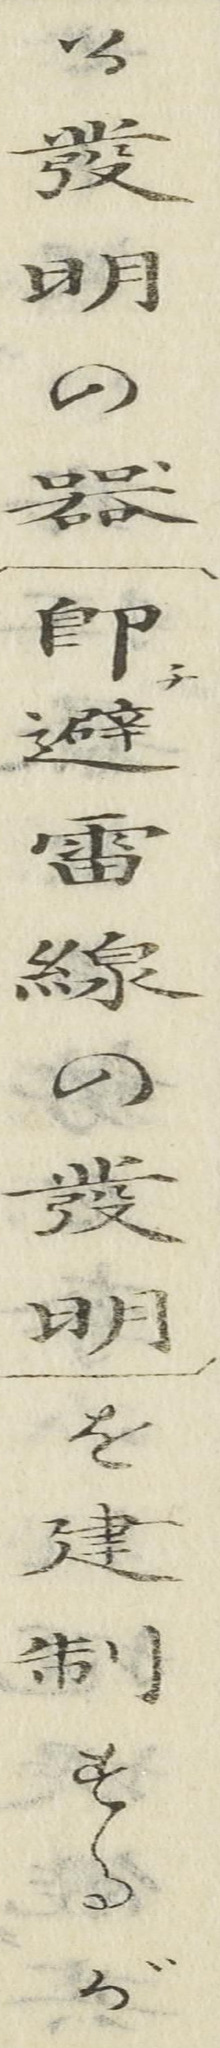る発明の器〔即避雷線の発明〕を建制するが
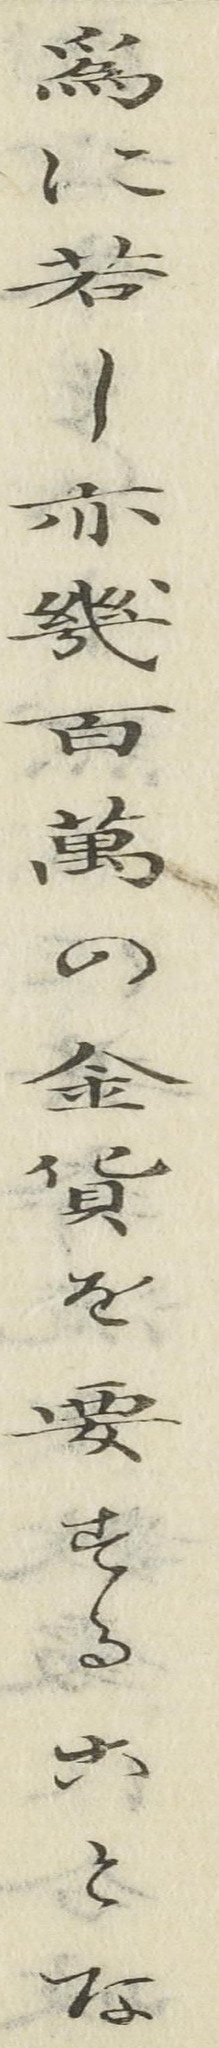為に若し亦幾百萬の金貨を要することな
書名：地震預防説
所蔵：東京大学地震研究所図書室 Earthquake Research Institute Library, The University of Tokyo, JAPAN
